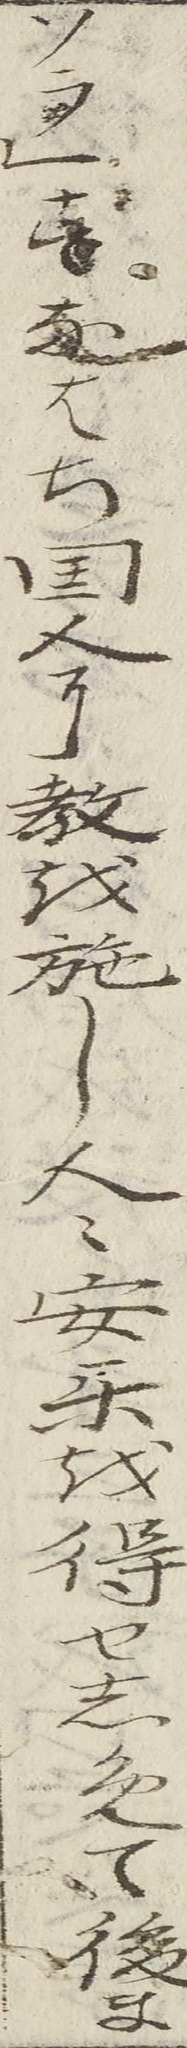ソラ」すなはち国人に教を施し人々安楽を得せしめて後ま
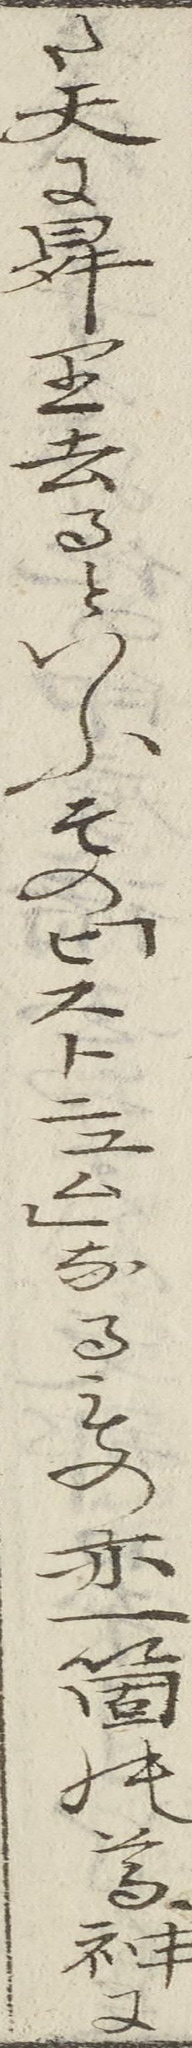た天に昇り去るといふその「ヒスト二ュム」なるもの亦一箇の尊神に
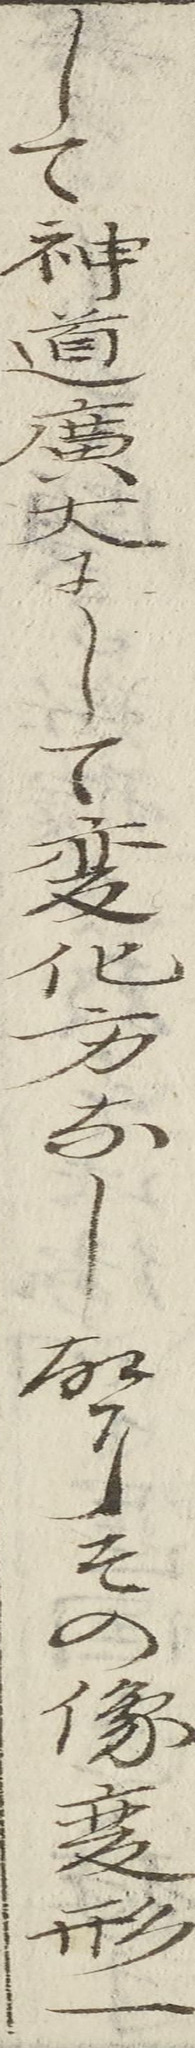して神道広大にして変化方なし故にその像変形一
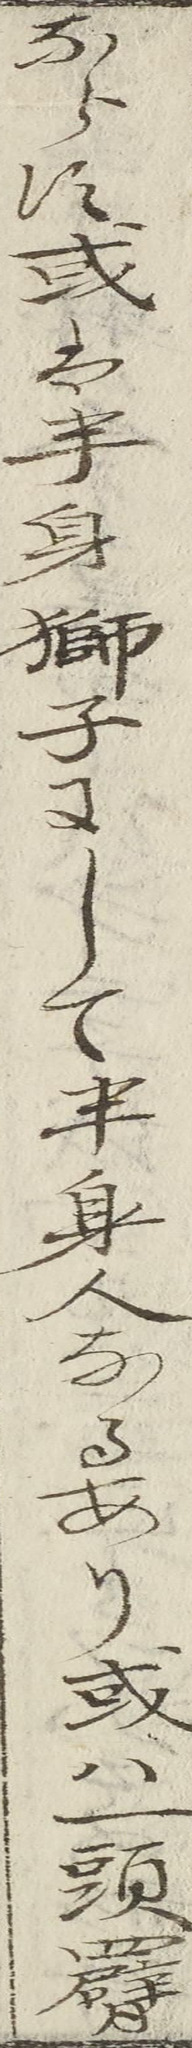ならす或は半身獅子にして半身人なるあり或ハ一頭四臂
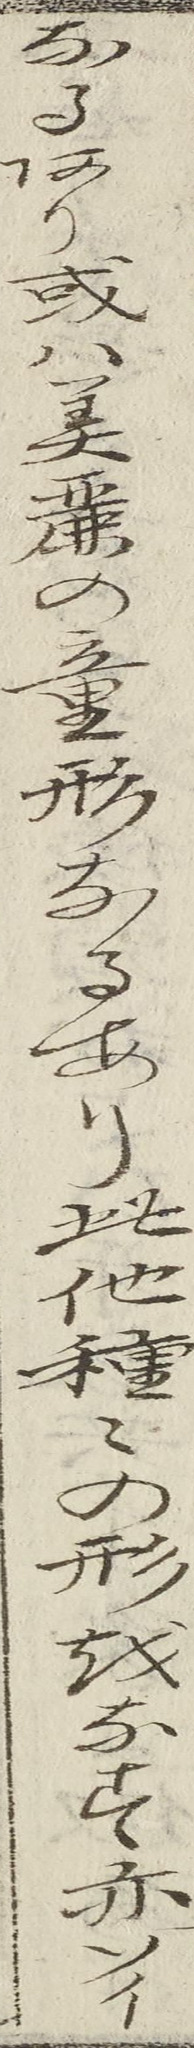なるあり或ハ美麗の童形なるあり此他種々の形なす「ソイ
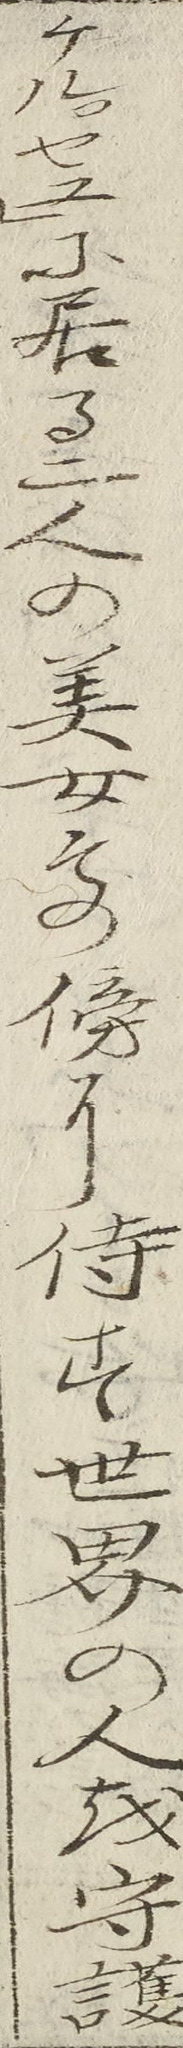ケル。セュ」に居る二人の美女その傍に侍す世界の人を守護
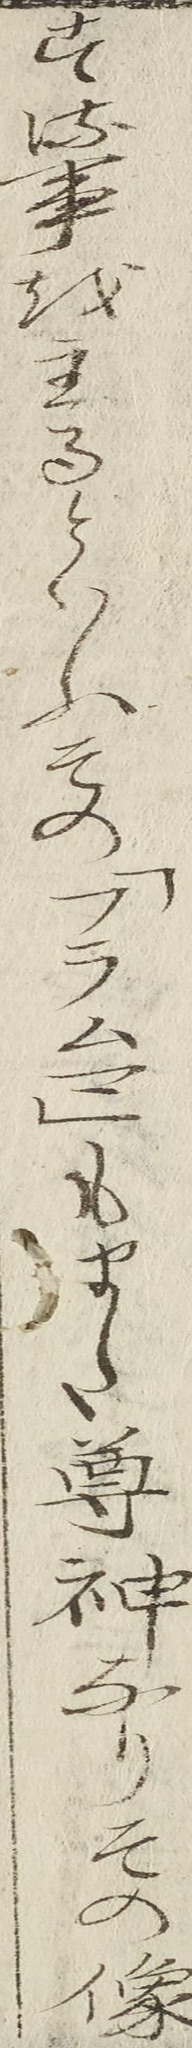することを主るといふその「フラムマ」もまた尊神なりその像
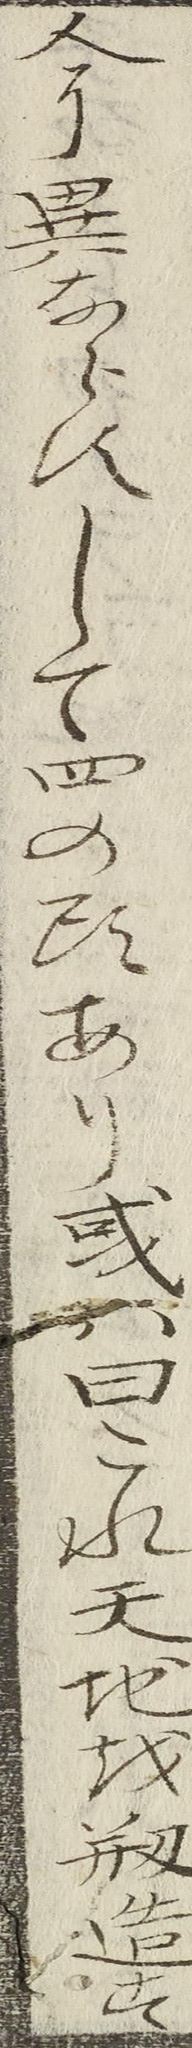人に異ならすして四の頭あり或ハ曰これ天地を剏造す
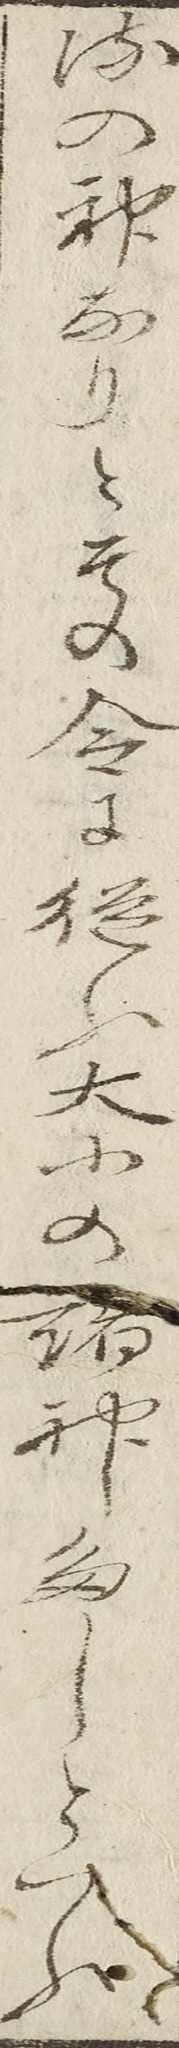るの神なりとその令に従ふ大小の諸神多しといふ
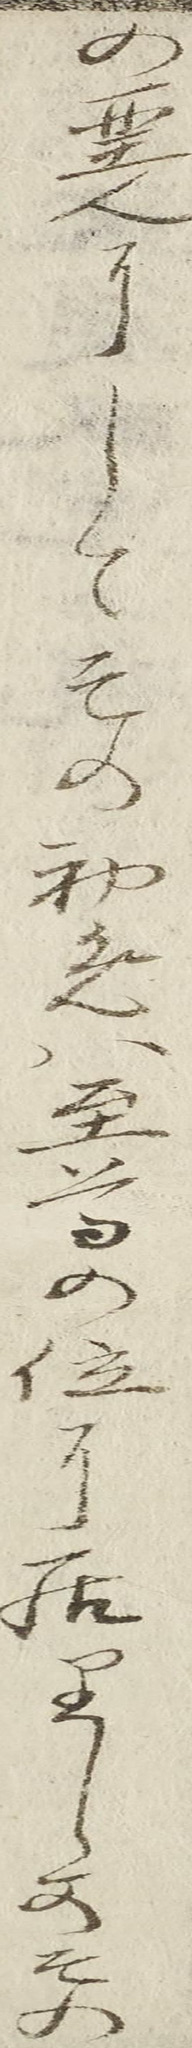の垔人にしてその初めハ至尊の位に居りしかその
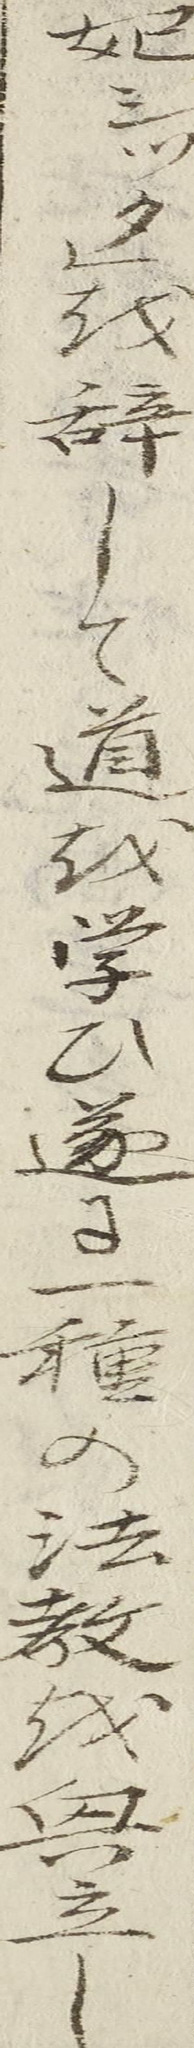妃「シッタ」を辞して道を学ひ遂に一種の法教を興立し
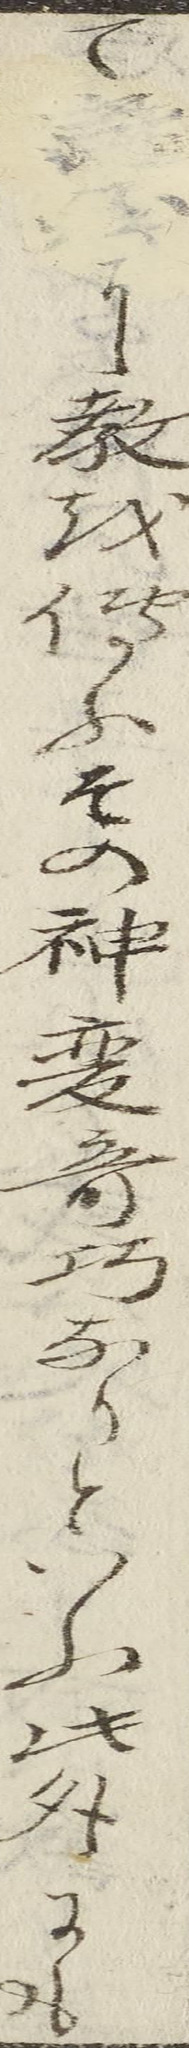て諸国に教を伝ふその神変奇巧なりといふ此外にも
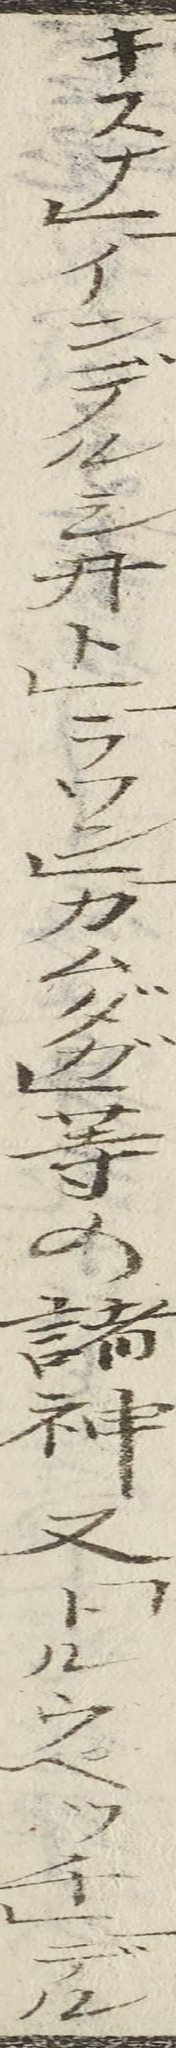「キスナ」「インデルシ井ㇳ」「ラワン」「カムダガ」等の諸神又「トルウぺッチ」「デル
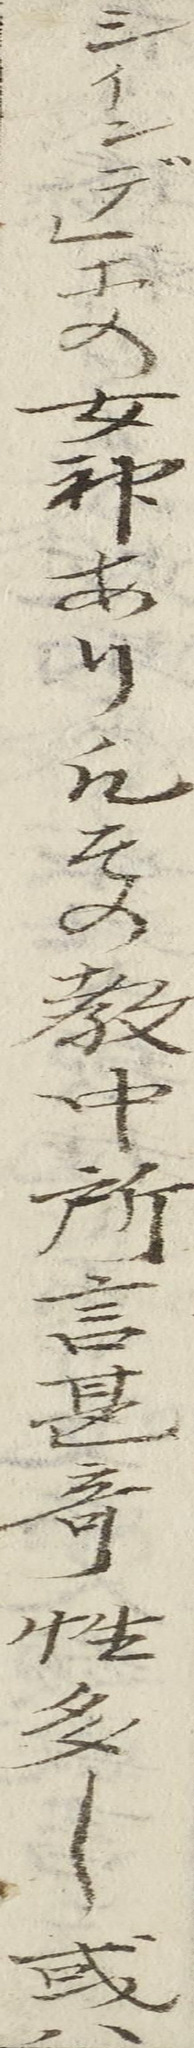シインデ」等の女神あり凡その教中所言甚奇多し或ハ
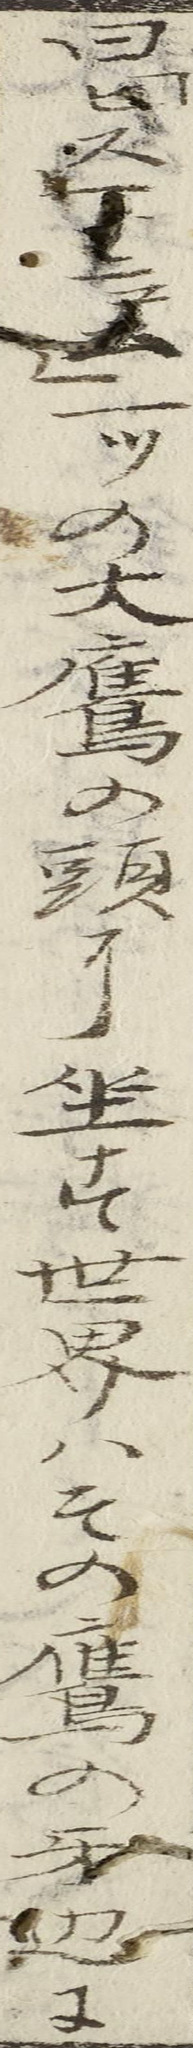曰「ヒスト二ュム」一ッの大鷹の頭に座す世界ハその鷹の牙辺に
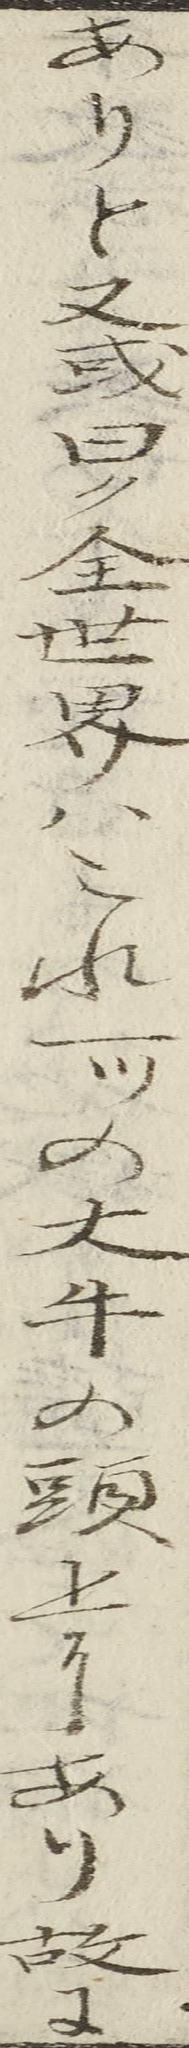ありと又或曰ク全世界ハこれ一ッの大牛の頭上にあり故に
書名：西洋雜記　坤
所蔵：東京大学地震研究所図書室 Earthquake Research Institute Library, The University of Tokyo, JAPAN
